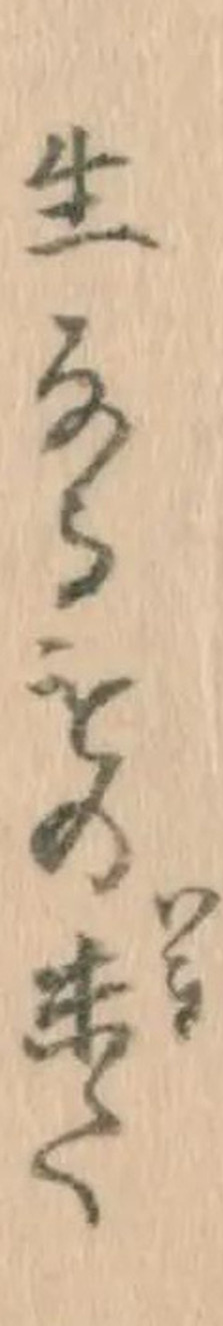生なるもの未た
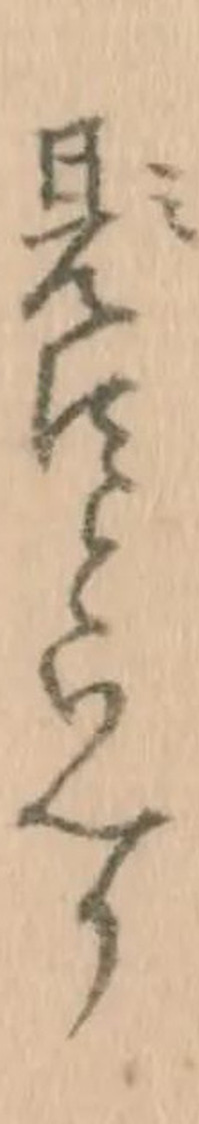見すといへり
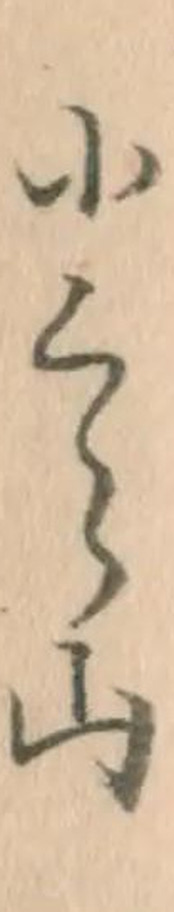小くら山
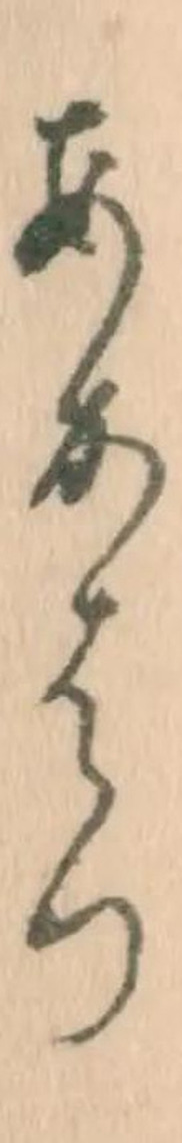あかはつ
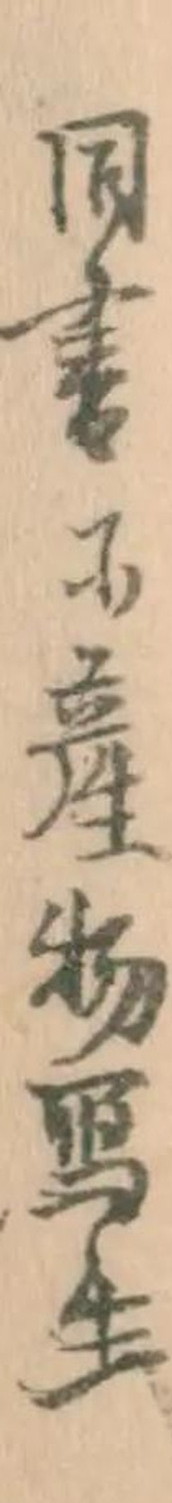同書に産物写生
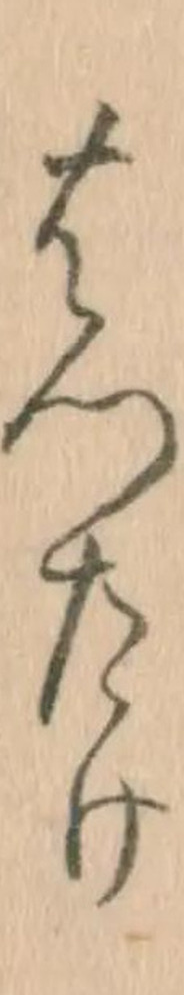はつたけ
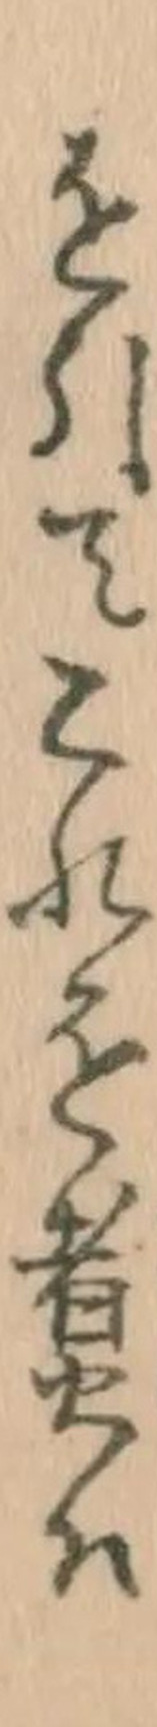を引てこれを煮は
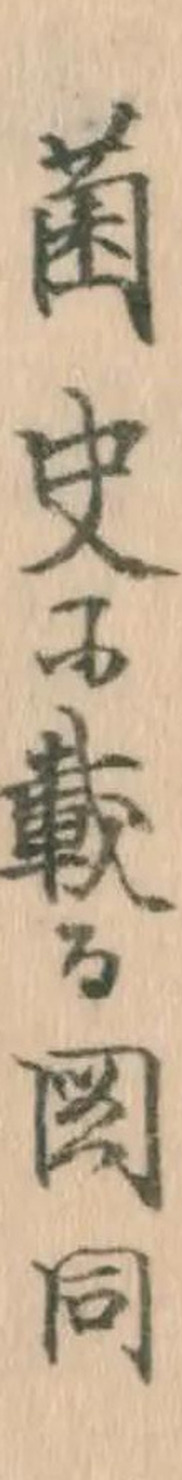菌史に載る図同
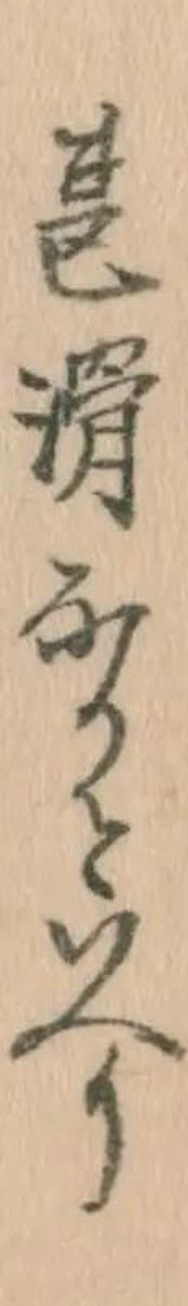甚滑なりといへり
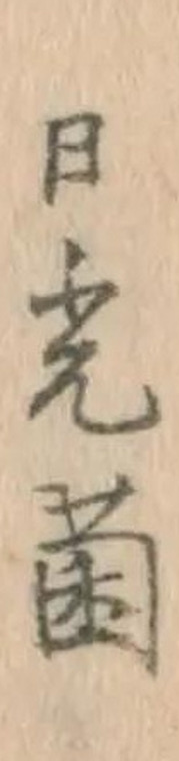日光菌
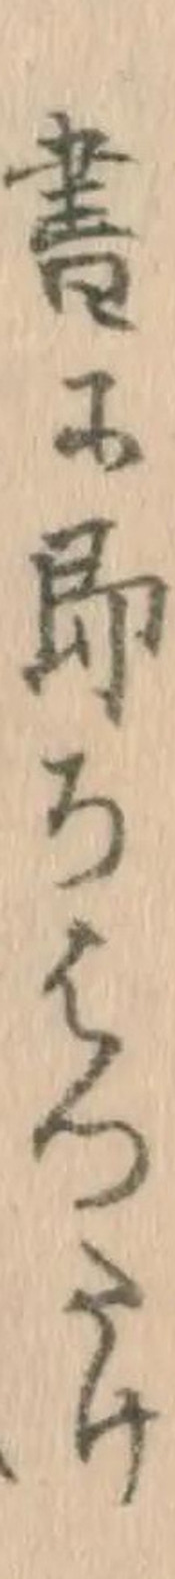書に即ちはつたけ
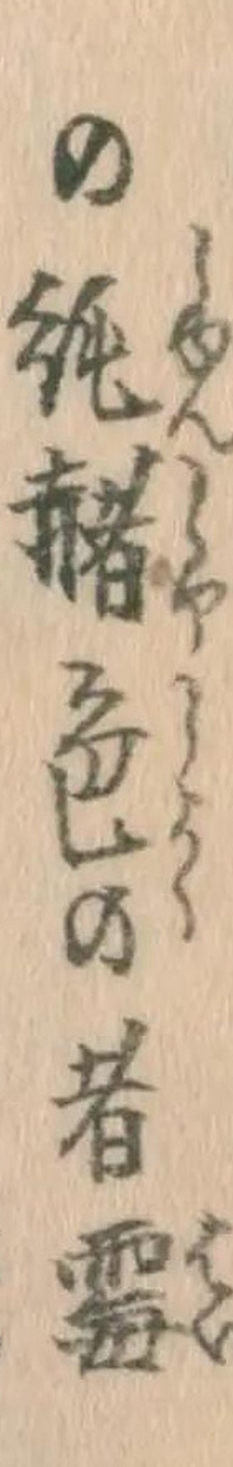の純赭色の者霉
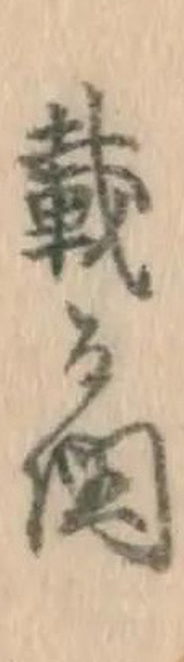載る図
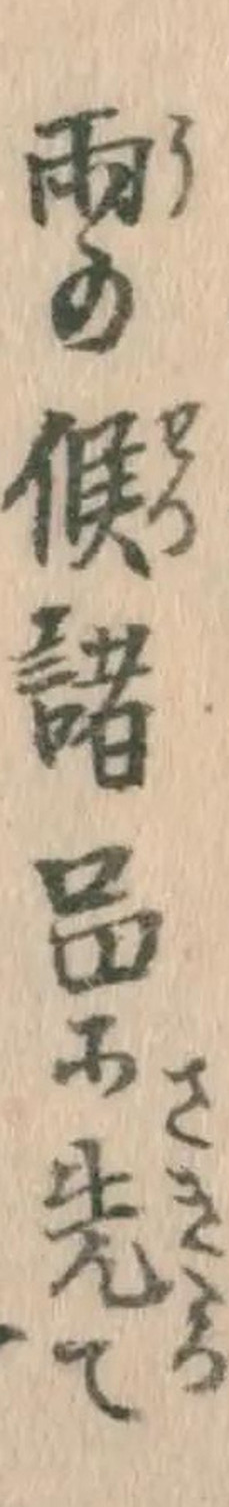雨の候諸品に先て
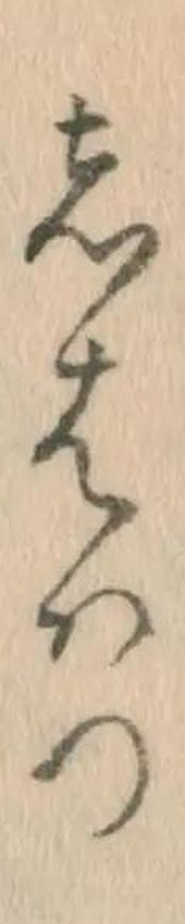しははつ
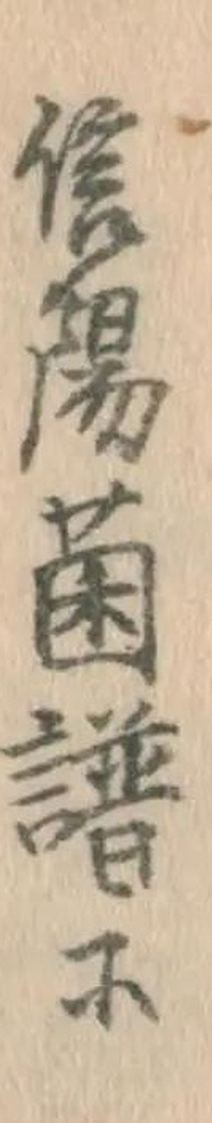信陽菌譜に
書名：本草図譜. 巻55-57
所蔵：国立国会図書館 National Diet Library, JAPAN
